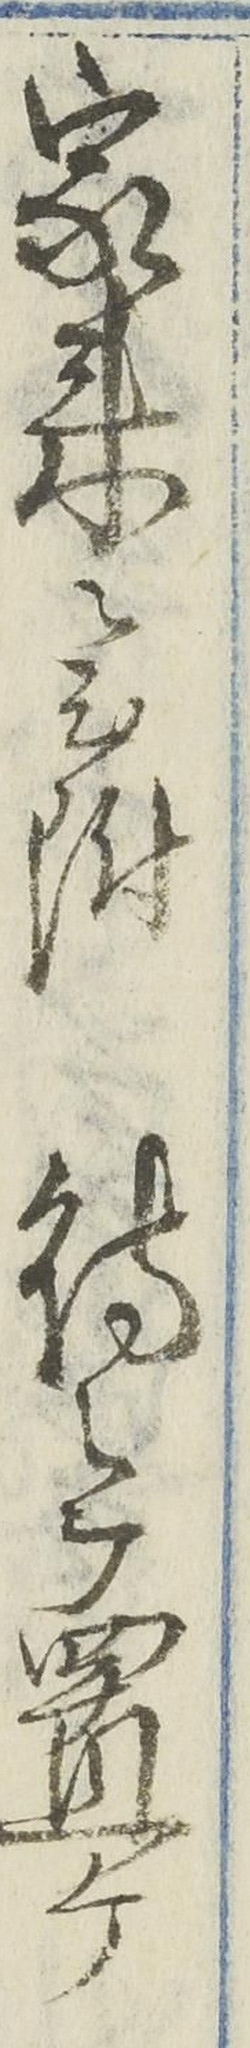家来ニ云附待シテ置ケ
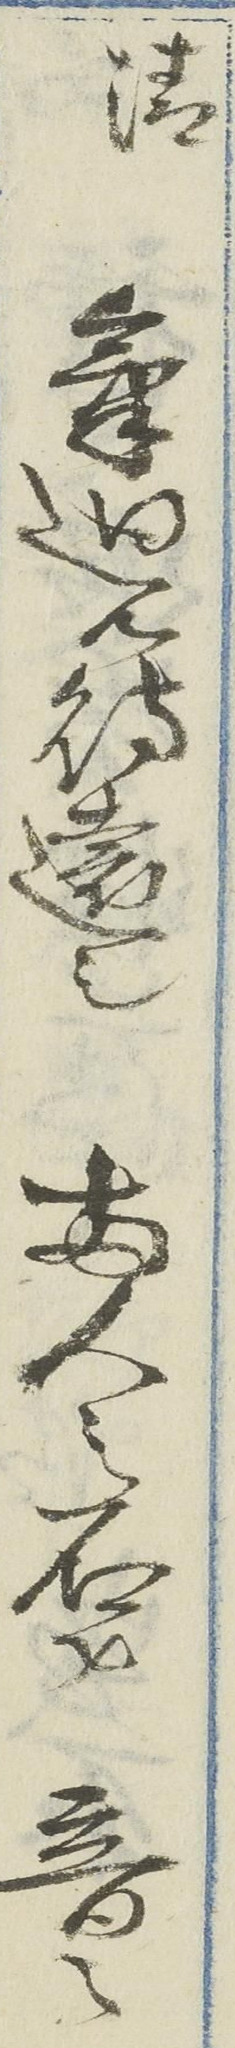清氣迫ル待遠シ両人之石ヲ音之
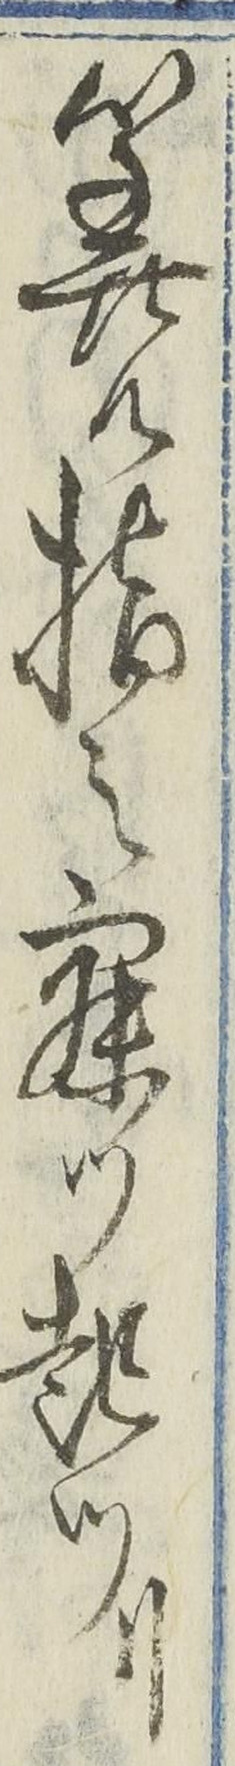算ル指之寝ツ起ツ
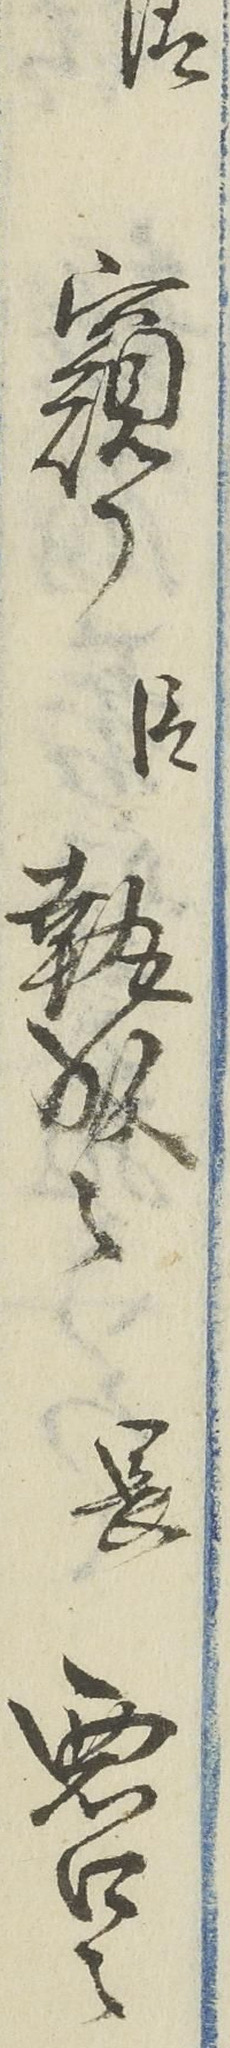清窺り臣執成之長悪口也

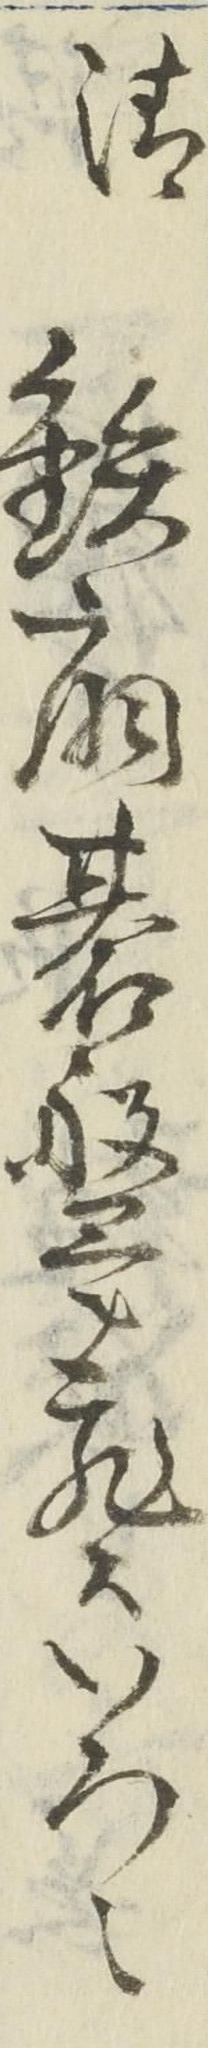清鉄扇碁盤ヲ飛スいろ之
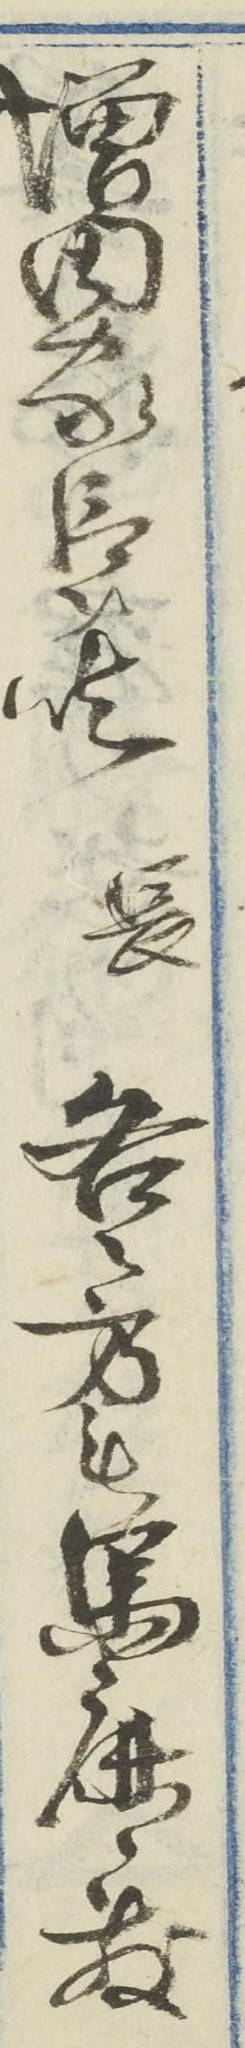増田家臣ヲ叱長各々方も馬鹿〻敷
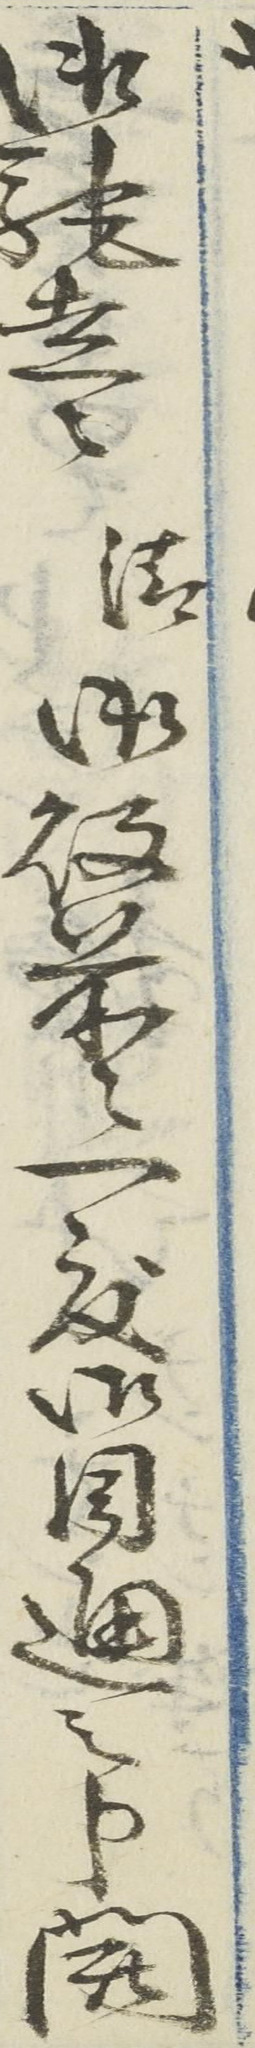御馳走之清御役前ニ一度御目通シ申開
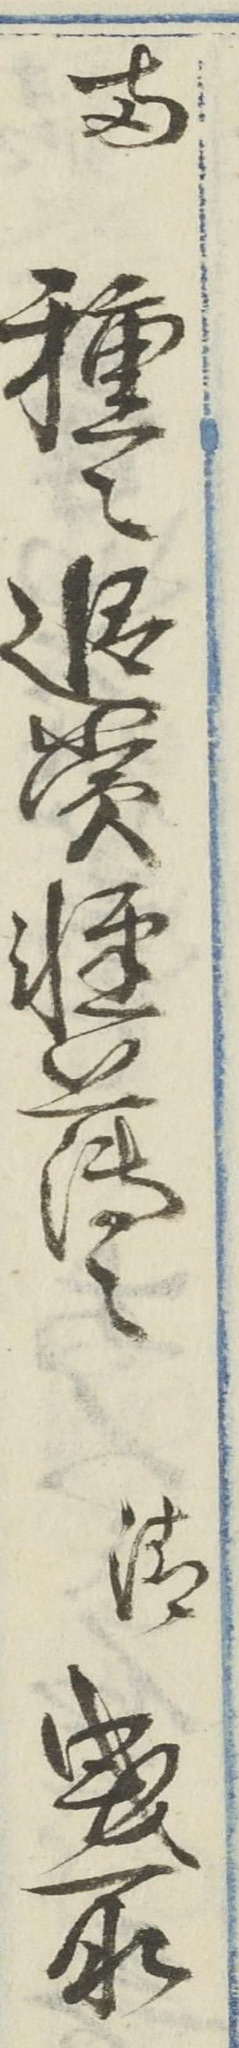両種〻追賞軽薄之清曳取
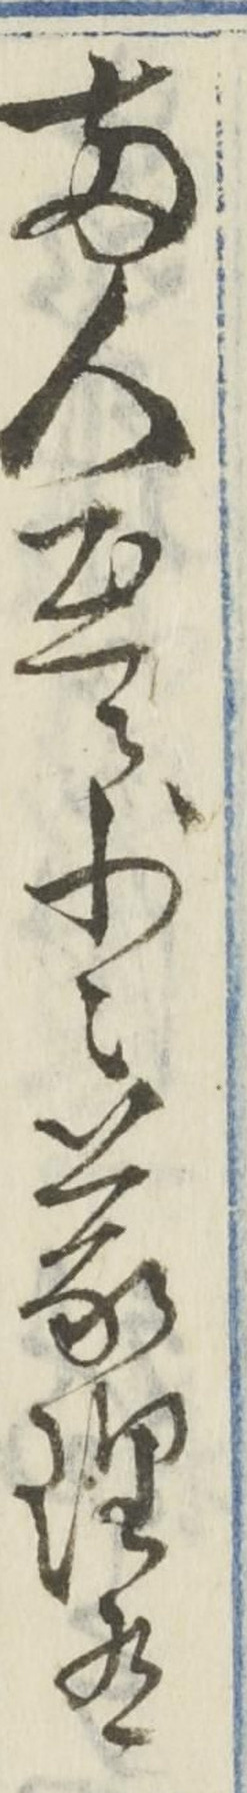両人云一ニ少〻義理有
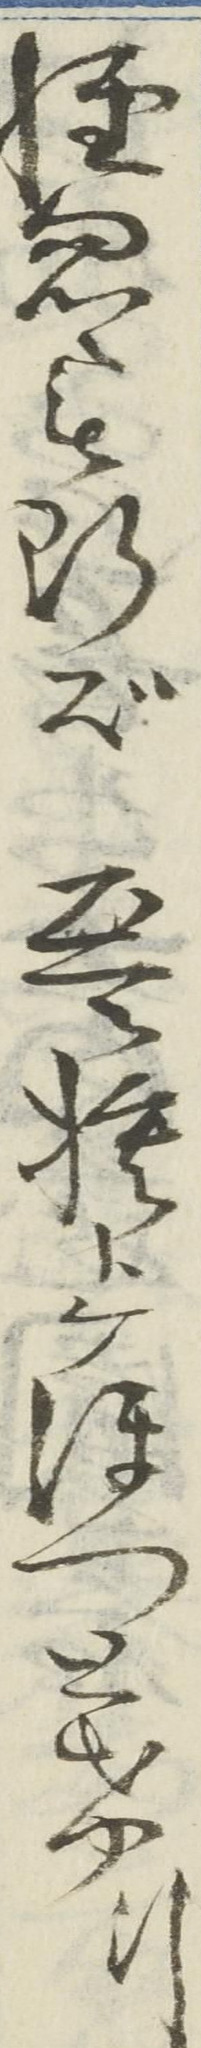軽忽ニも断ズ云ニ捨トケほつとけ
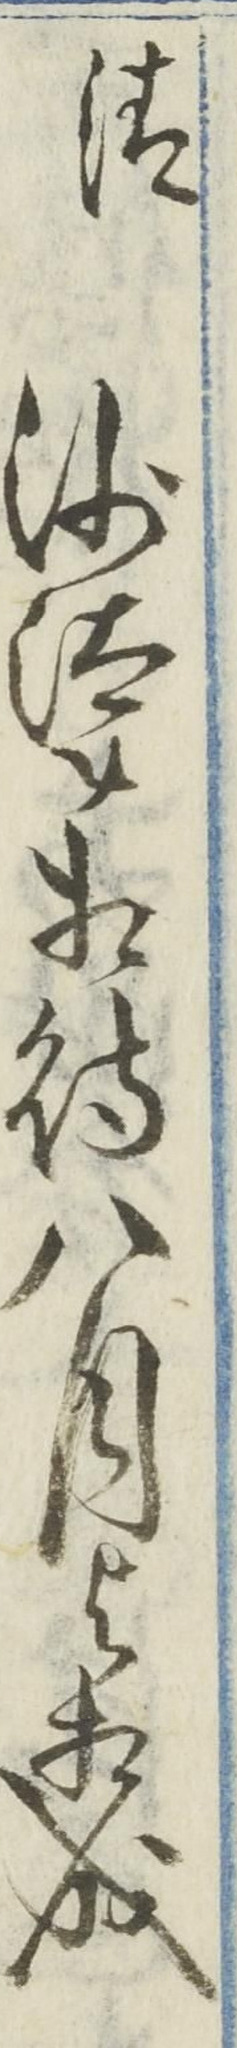清沙汰ヲ相待八月と相成
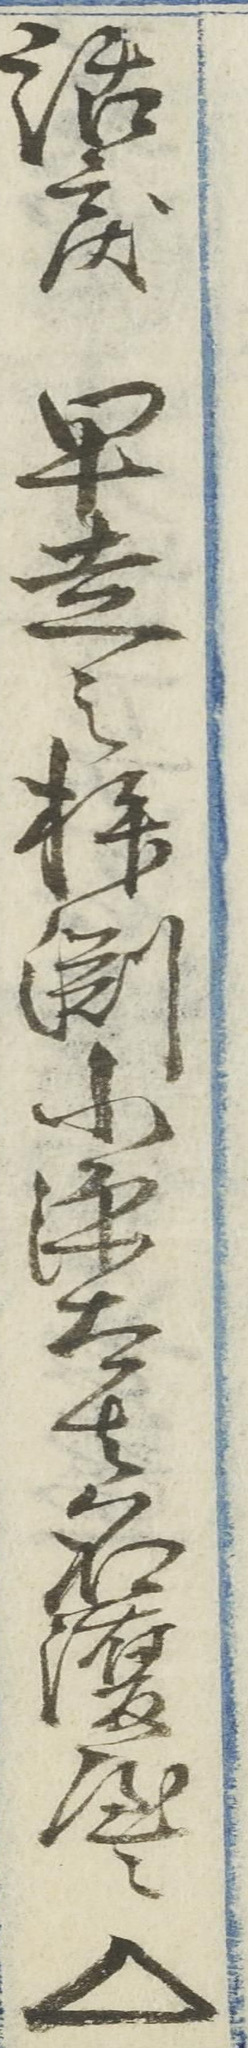話戻早走之杵渕小源太ハ名護屋之
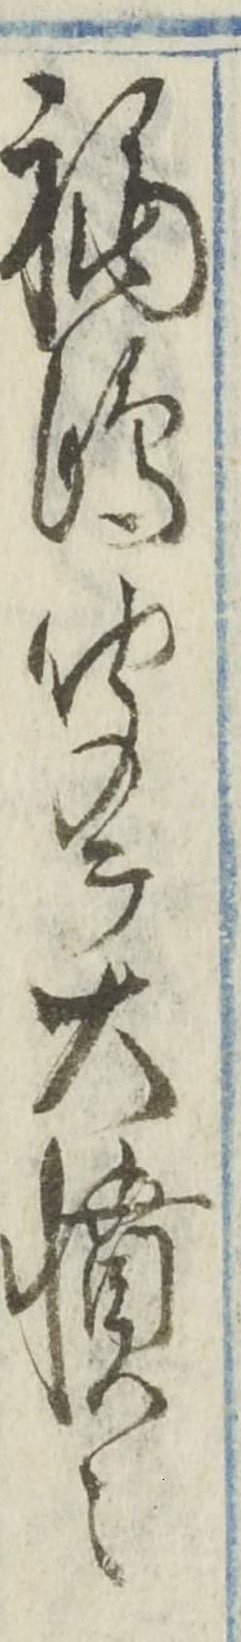福島聞テ大憤之
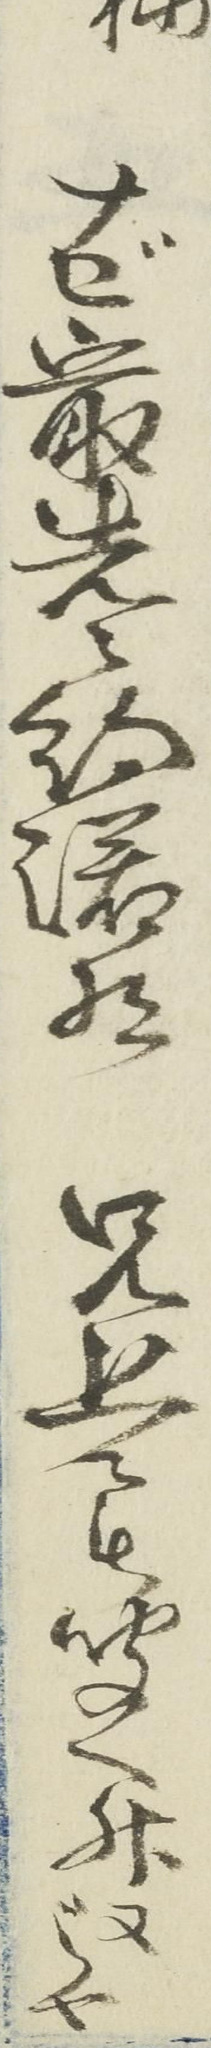福ナゼ最先ニ約諾有兄上ニモ聞ヘ升ヌジヤ
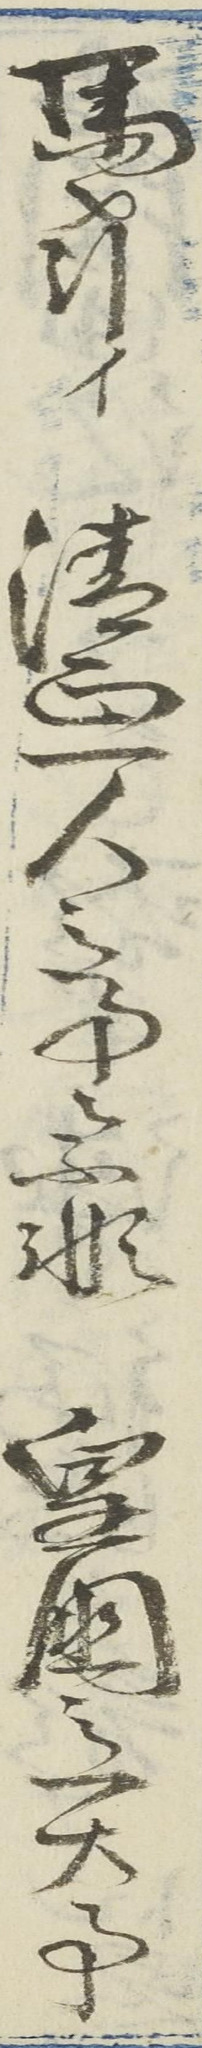馬ヲ引イ清正一人之事ニ不非皇国之一大事
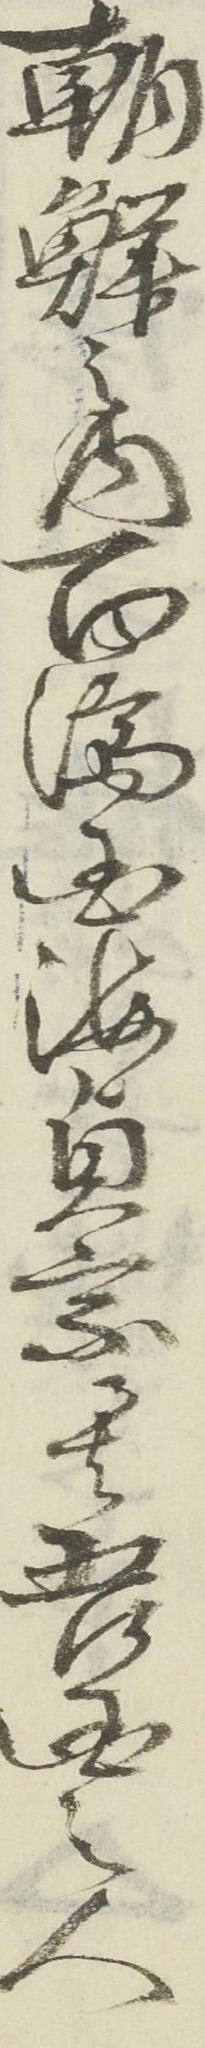朝鮮之内百済国海貞家ニハ吾国之人
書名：伏水大地震
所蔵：東京大学地震研究所図書室 Earthquake Research Institute Library, The University of Tokyo, JAPAN
